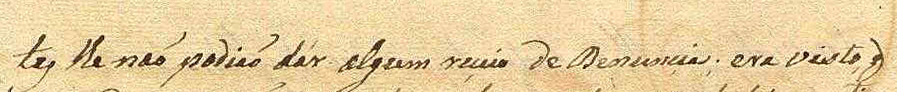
tes lhe naõ podiaõ dár algum receio de Denuncia; era visto, q̄
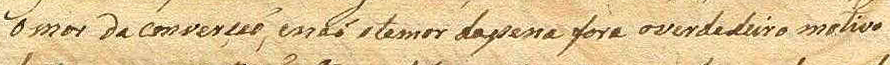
o mor da converçaõ, e naõ o temor da pena fora o verdadeiro motivo
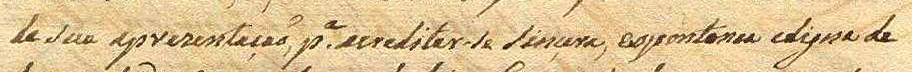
da sua aprezentaçaõ, p.a acreditar-se sincera, espontanea e digna de
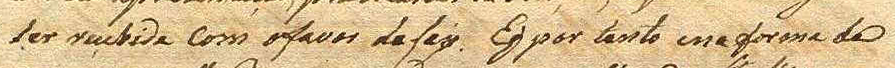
ser recebida com o favos da Ley. E q̄ por tanto e na forma da
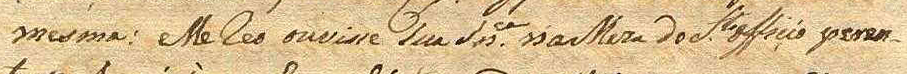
mesma: elle Reo ouvisse sua Sn.ca na Meza do S.to officio peran
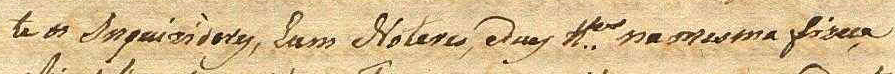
te os Inquizidores, hum Notareo, e duas tt.as na mesma fizece
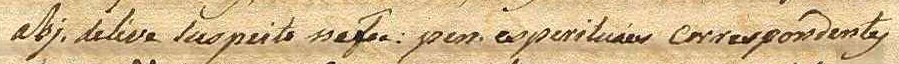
abj. de live suspeito na fee: per esperituaes correspondentes
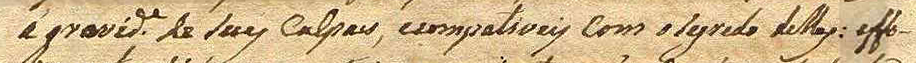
á gravid.e de suas culpas, e compativeis com o segredo dellas: e ffo
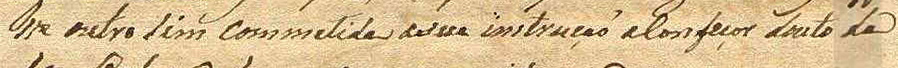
sse outrosim commetida a sua instruçaõ a Confeçor douto da
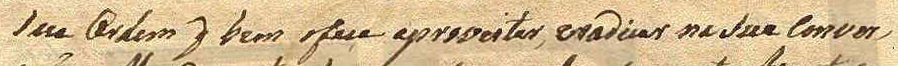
sua Ordem q̄ bem o faça aproveitar, erradicar na sua conver
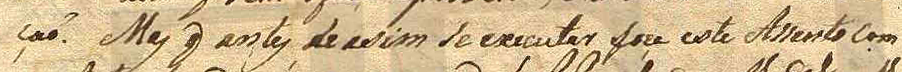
çaõ. Mas q̄ antes de asim se executar faça este Assento com
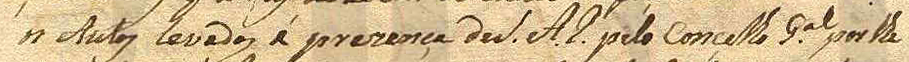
os Autos levados á prezença de S. A. R. pelo Concelho G.al por lhe
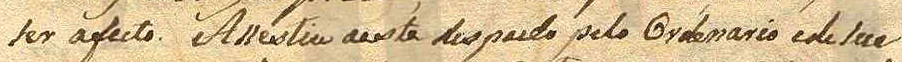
ser afecto. Assestiu a este despacho pelo Ordenario e de sua
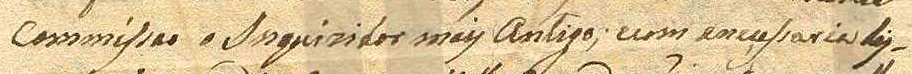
commissao o Inquizidor mais Antigo; e com a necessaria dis
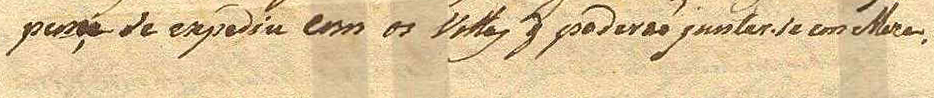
pença se expediu com os Vottos q̄ poderaõ juntar-se em Meza.
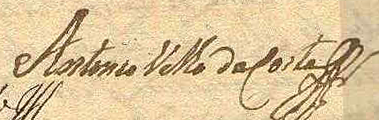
Antonio Velho da Costa
